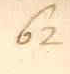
62
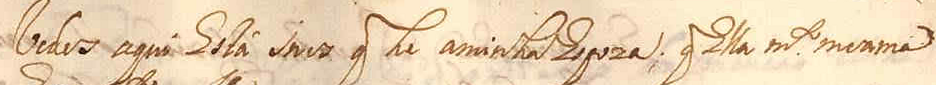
Vedes aqui Está Ines q̄ he a minha Espoza, q̄ Ella m.to me ama
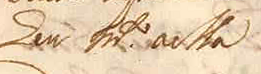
E eu m.to a ella
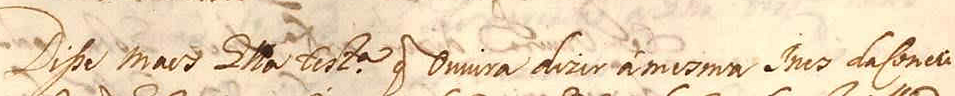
Disse maes Ella test.a q̄ ouuira dizer á mesma Ines da Concei
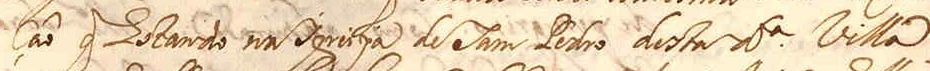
çaõ q̄ Estando na Igreiya de Sam Pedro desta d.a Villa
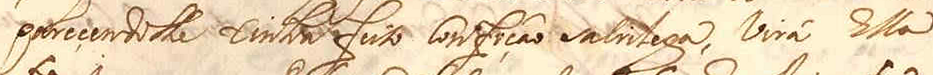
parecendolhe tinha feito confiçaõ sacrilega, vira Ella
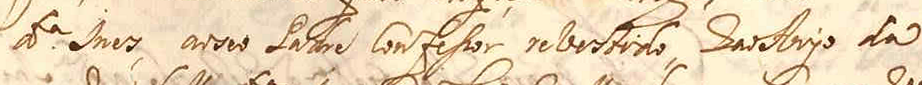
d̄.a Ines, ao seo Padre Confessor revestido, E ao Anyo da
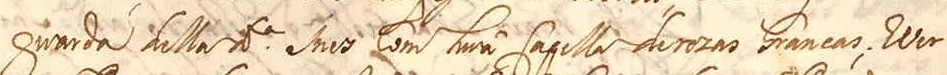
Guarda della d.a Ines com huā Capella de rozas brancas, E ver
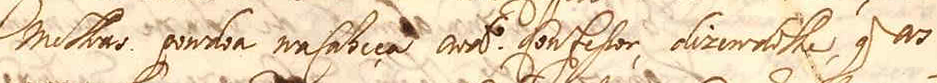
melhas, pondoa na Cabeça ao d.o Confessor, dizendolhe, q̄ as
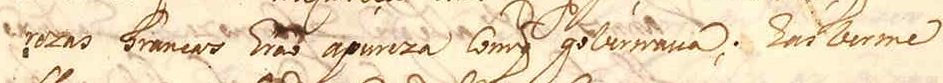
rozas brancas Erão a pureza Com q̄ governaua, E as verme
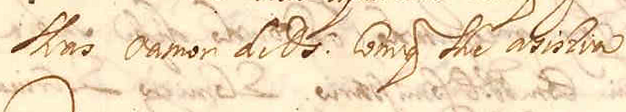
lhas o amor de Ds̄ Com q̄ lhe asistia
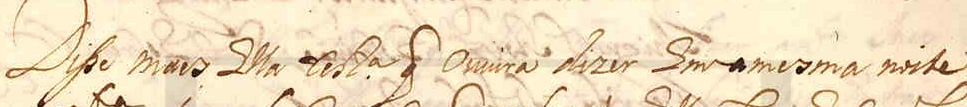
Disse maes Ella test.a q̄ ouuira dizer Em a mesma noite
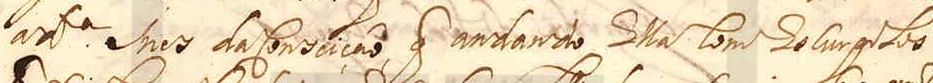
a d.a Ines da Conseiçaõ, q̄ andando Ella com ho Escurpolos
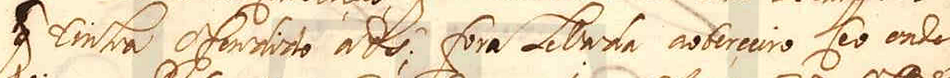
q̄ tinha ofendido a ds̄ fora Levada ao terceiro Ceo onde
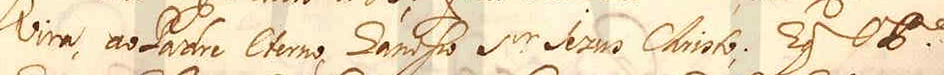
vira, ao Padre Eterno, E a nosso s.or Iezus Christo; E q̄ O P.e
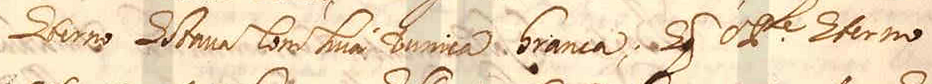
Eterno Estaua com huā tunica branca, E q̄ o P.e Eterno
